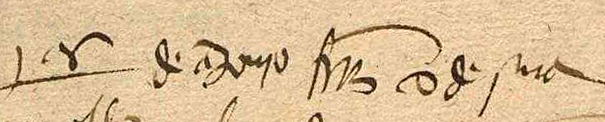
tas de ātonjo fr̄rz e de sua
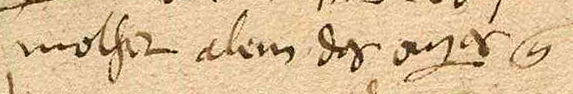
molher alem das outas q̄
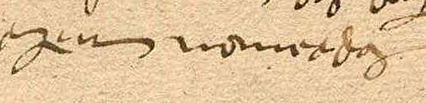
Ja tem nomeadas
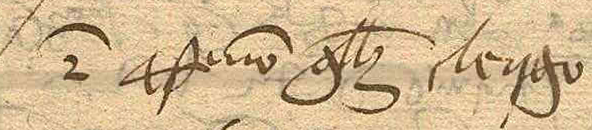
item Esteūo ḡllz clerjgo
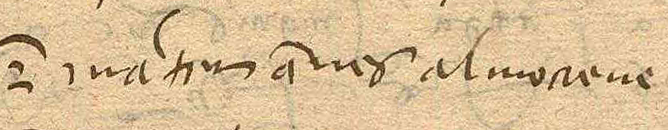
item mātim ānes almocreue
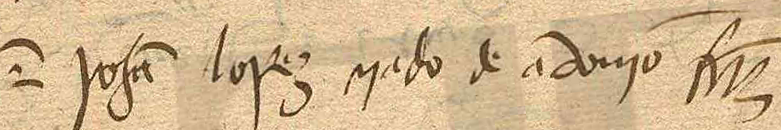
item Johā lopez crjado de ātonjo fr̄rz
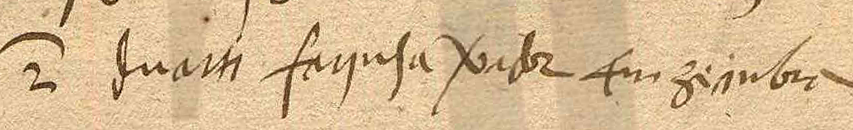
item duarte farjnha ꝟador Em zecinbra
